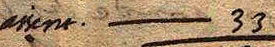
assent. – 33
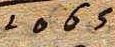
1065
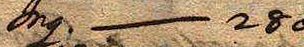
Inq. – 280
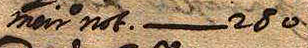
meiro not. – 280
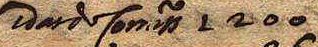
idas do Comissro 1200
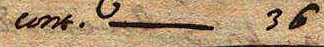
cont. – 36
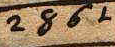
2861
